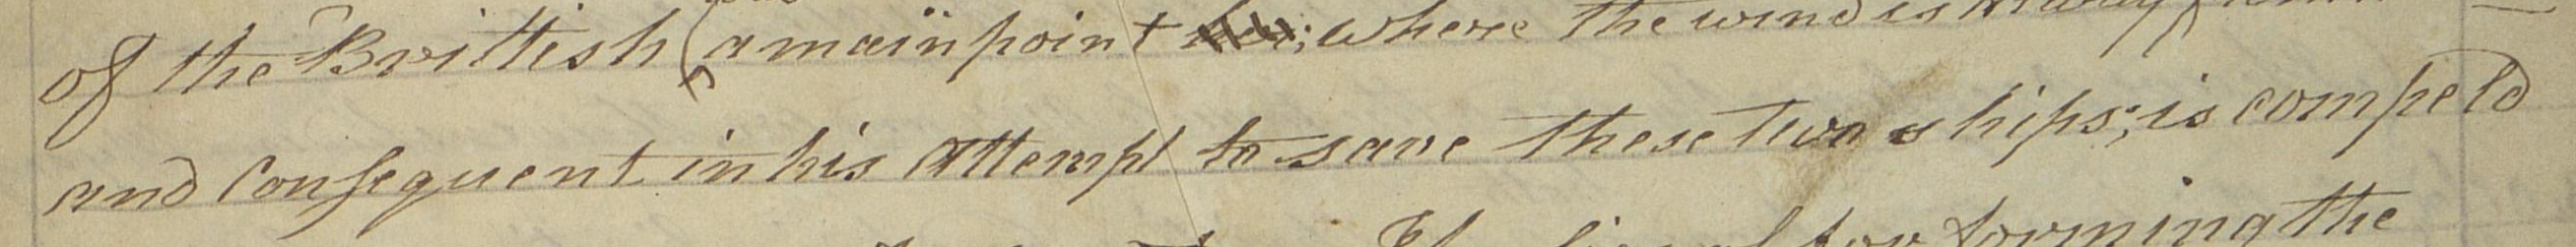and Consequent in his attempt to save these two ships; is compeld
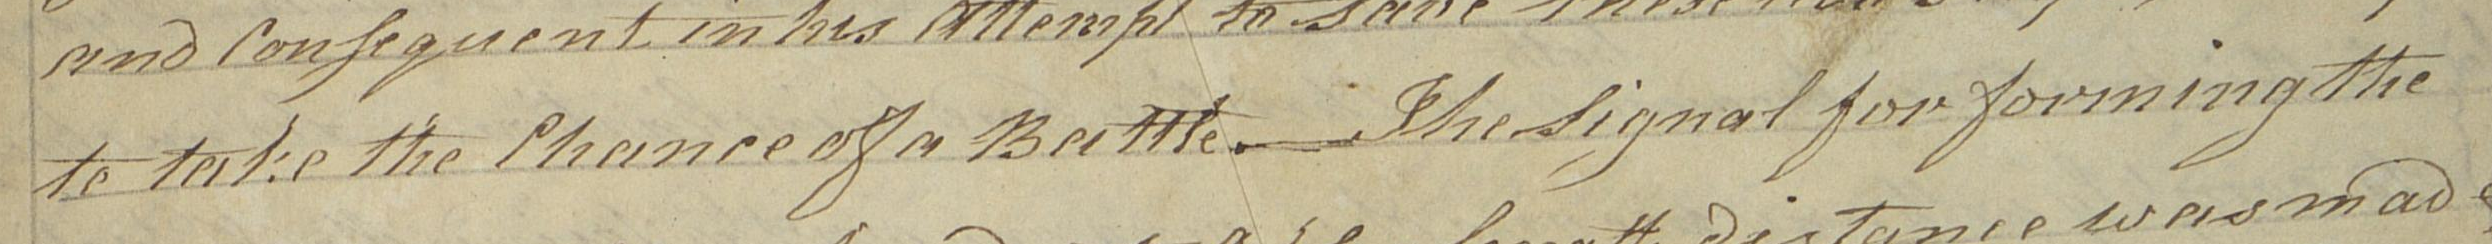to take the Chance of a Battle. The signal for forming the
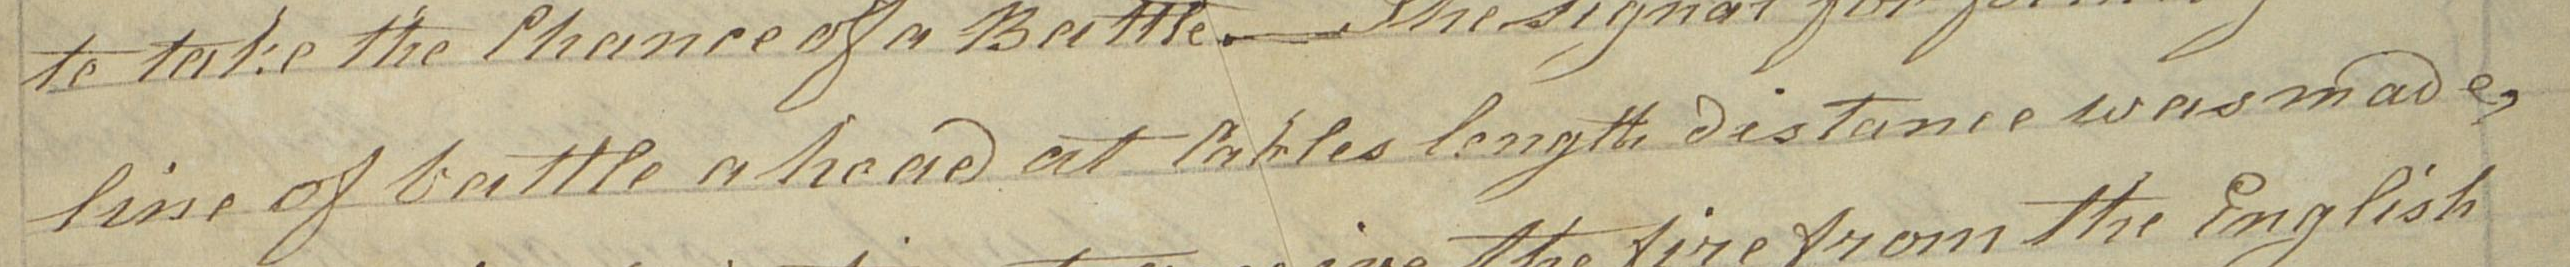line of battle a head at Cables length distance was made,
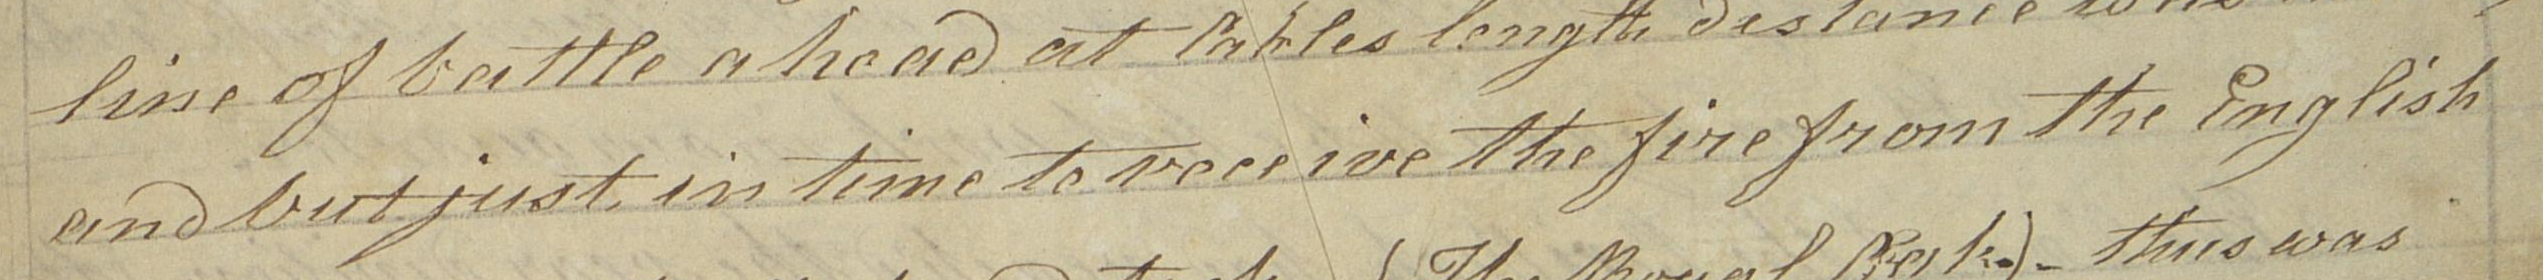and but just in time to receive the fire from the English
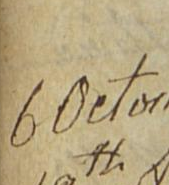6 OClock
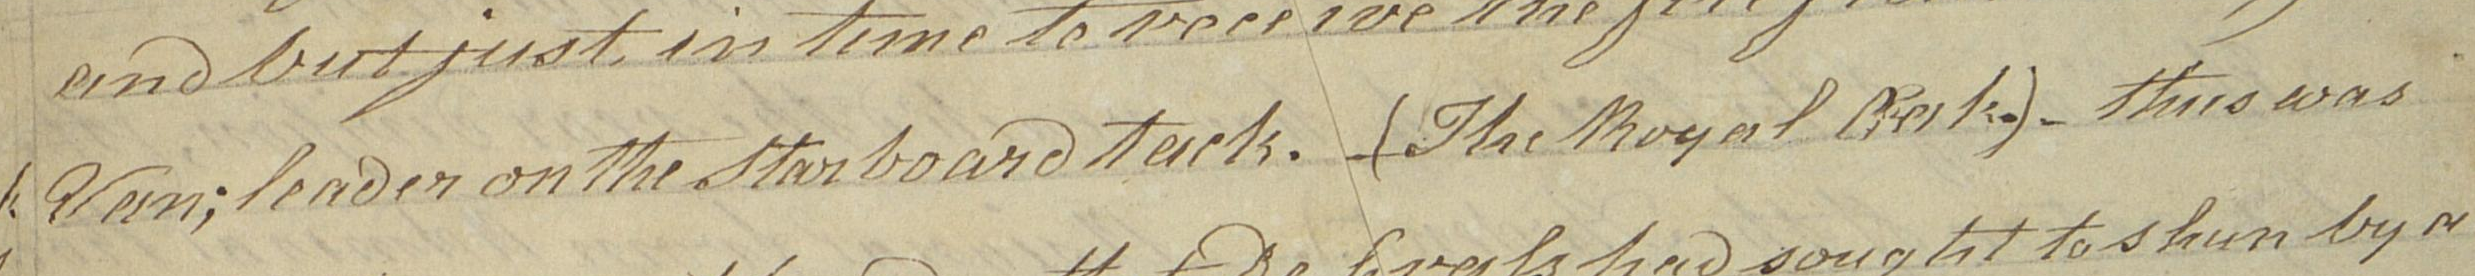I am; leader on the Starboard tack. (The Royal Oak.) this was
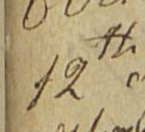12^th of
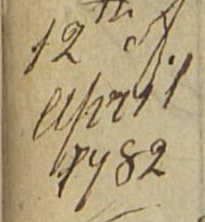April
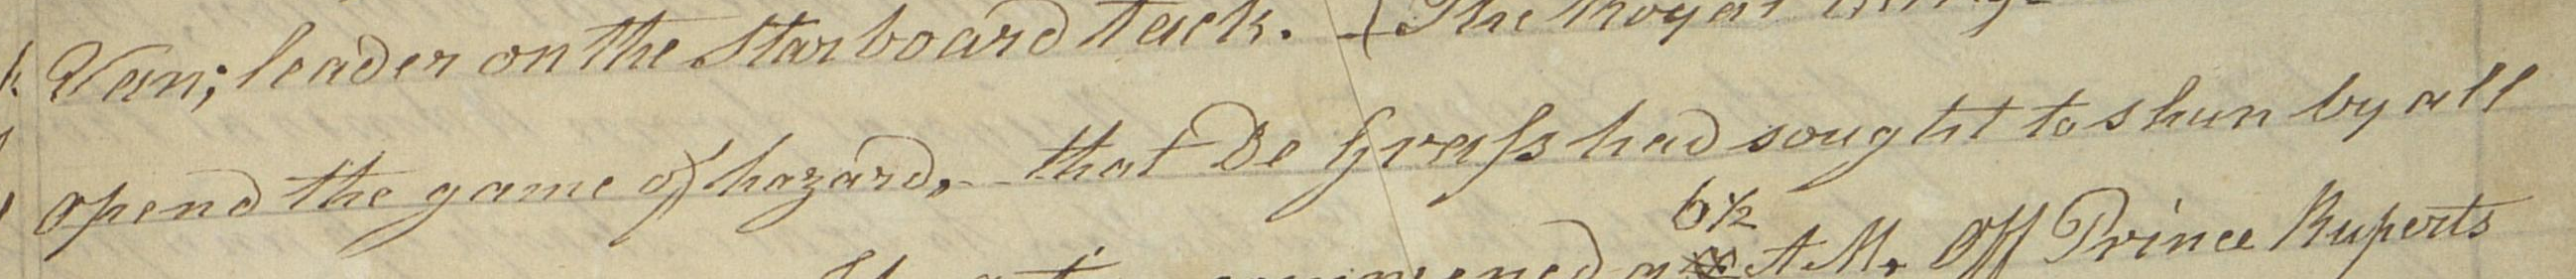opend the game of hazard, that De Grass had sought to shun by all
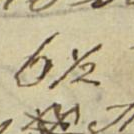6 1/2
